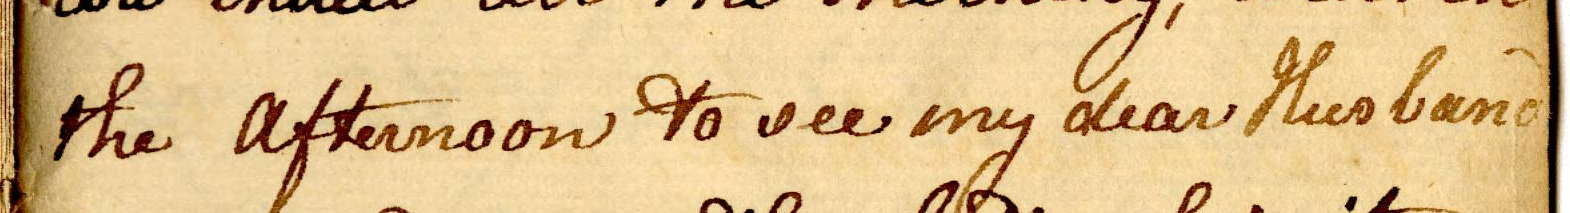the Afternoon to see my dear Husband
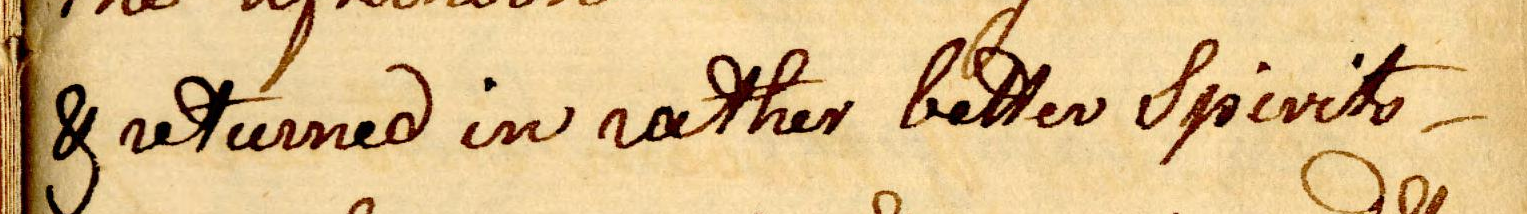& returned in rather better Spirits-
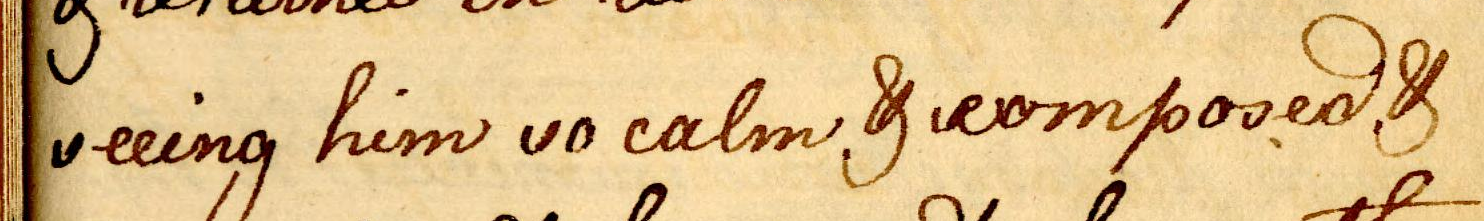seeing him so calm & composed &
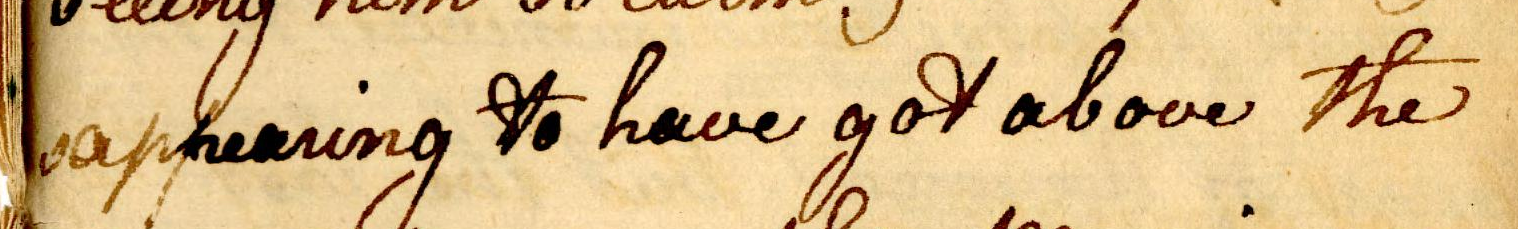appearing to have got above the
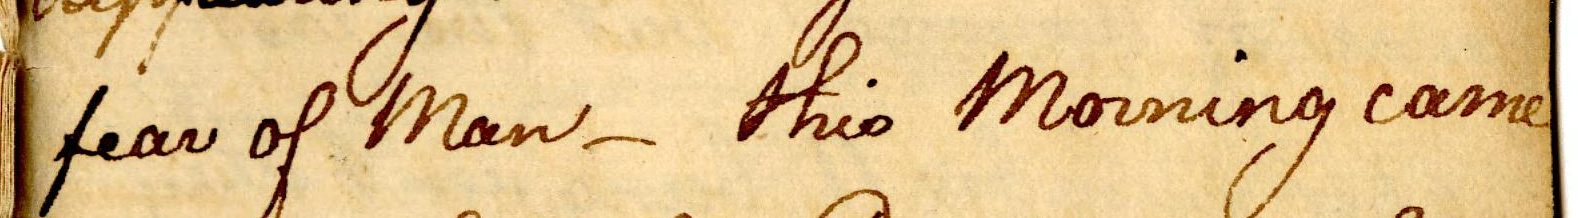fear of Man- this Morning came
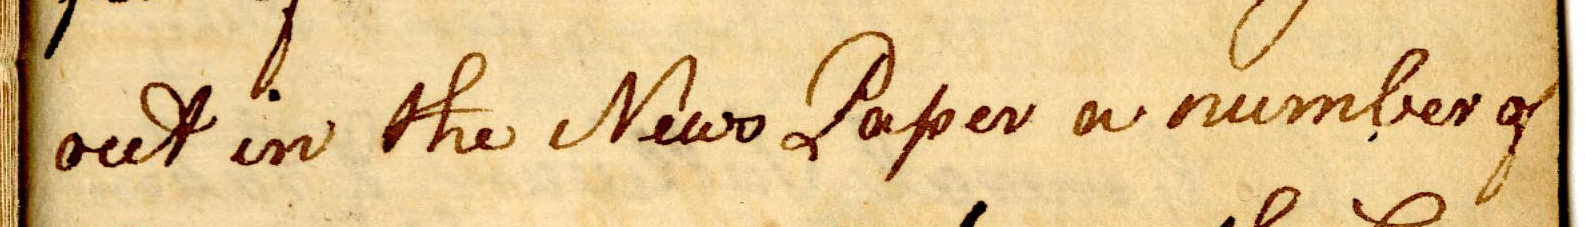out in the News Paper a number of
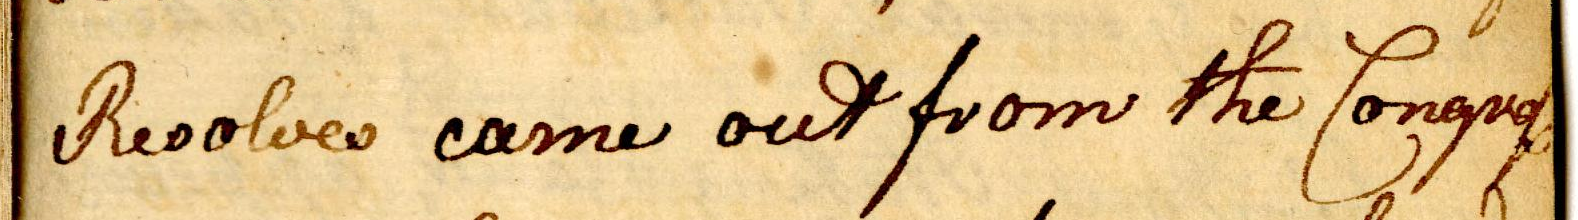Resolve came out from the Congress
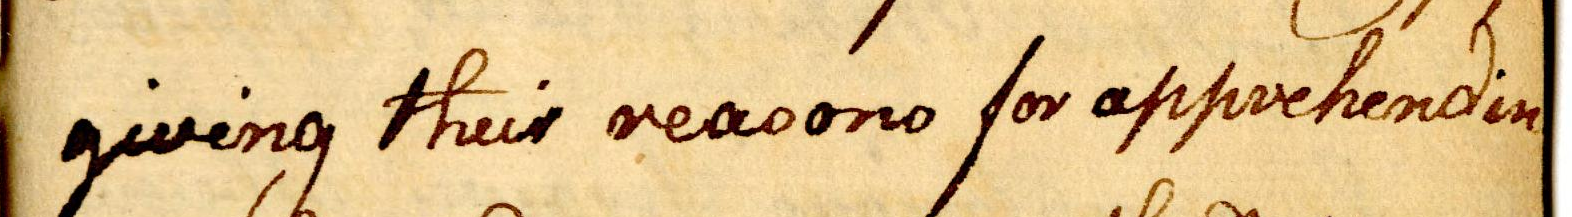giving their reasons for apprehendin
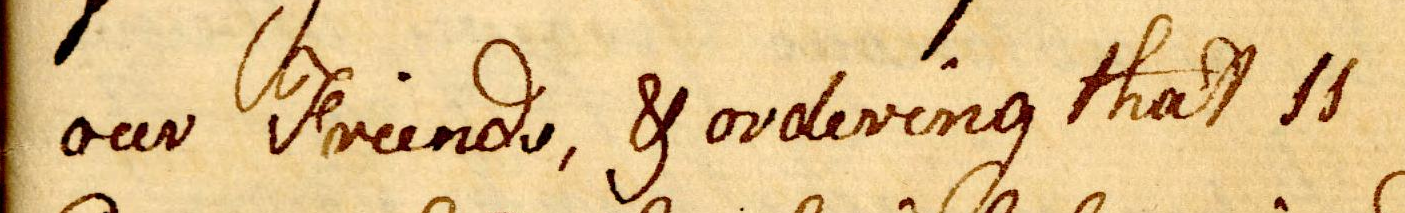our Friends, & ordering that 11
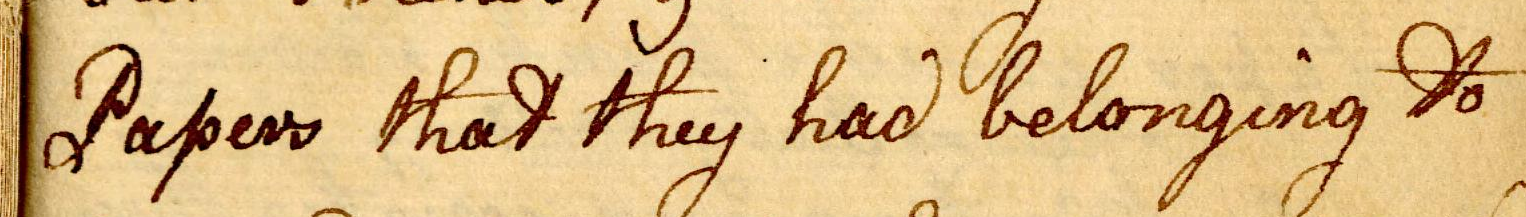Papers that they had belonging to
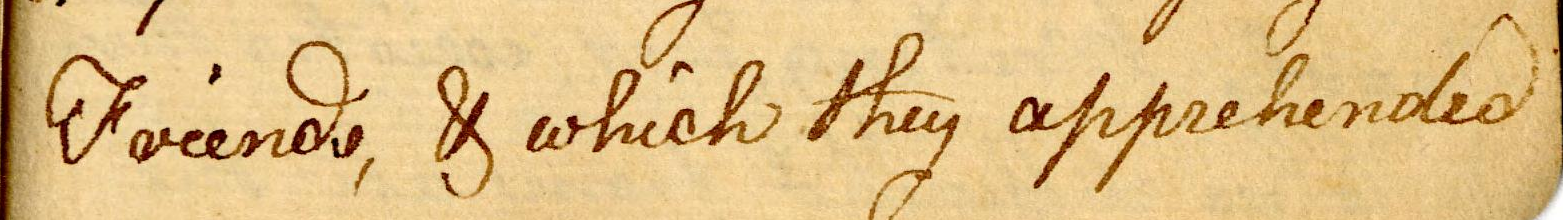Friends, & which they apprehended
